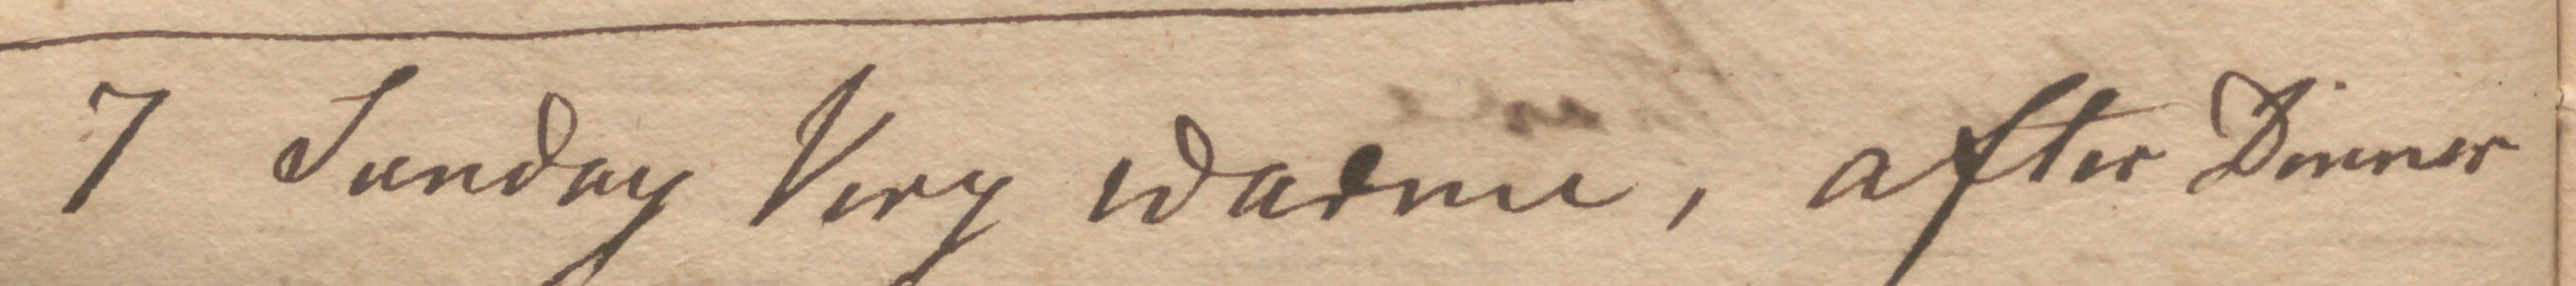7 Sunday Very warme, after Dinner
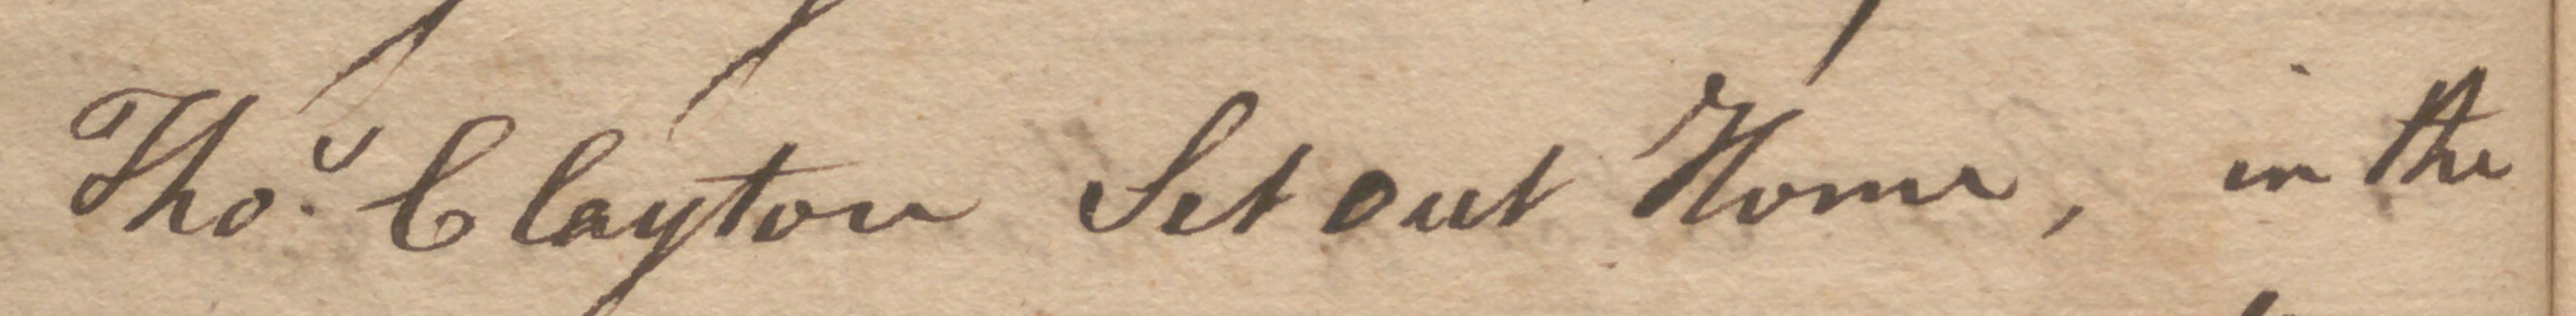Tho^s. Clayton Set out Home, in the
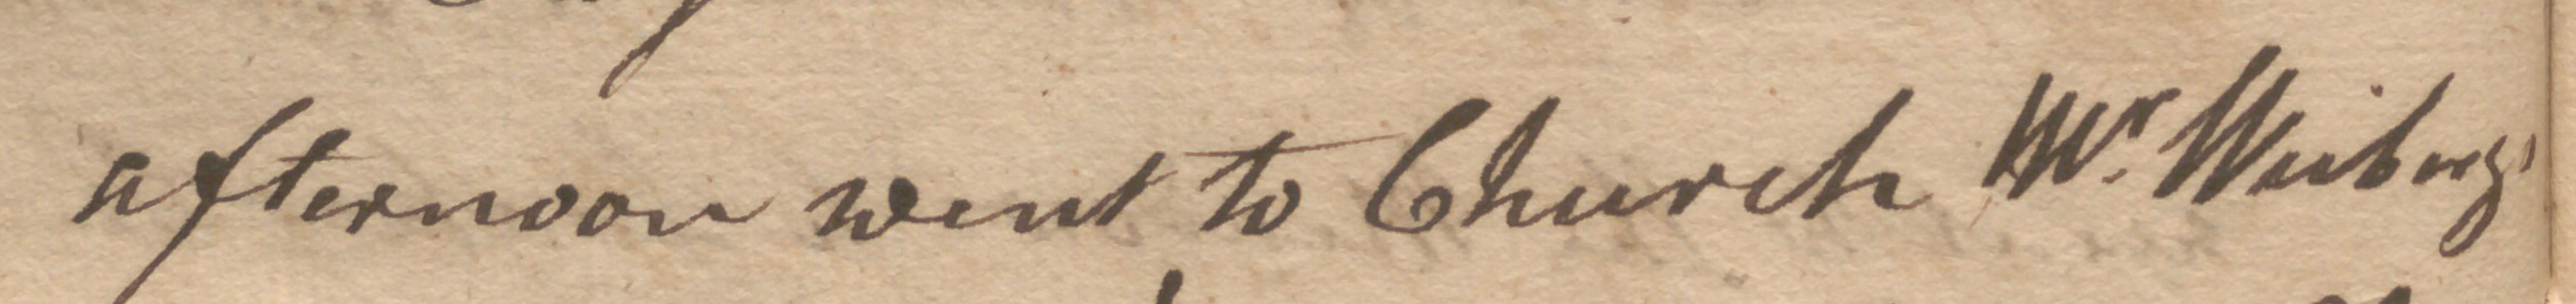afternoon went to Church M^r. Weibirg
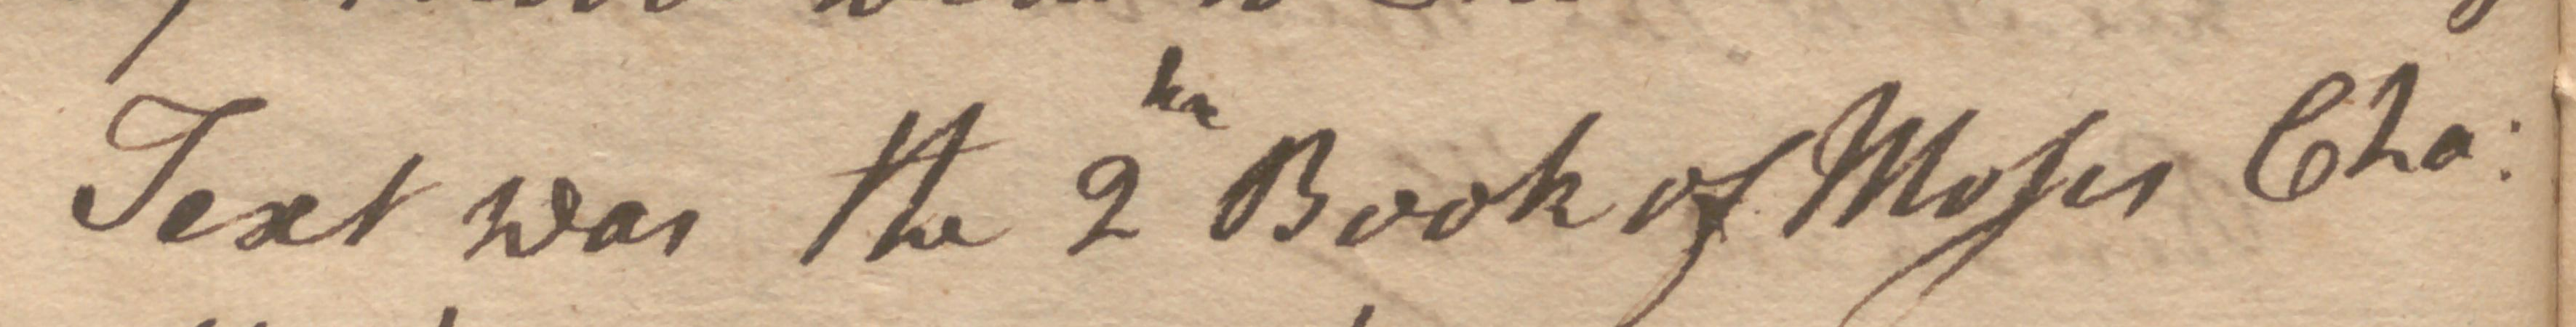Text was the 2^th Book of Moses Cha:
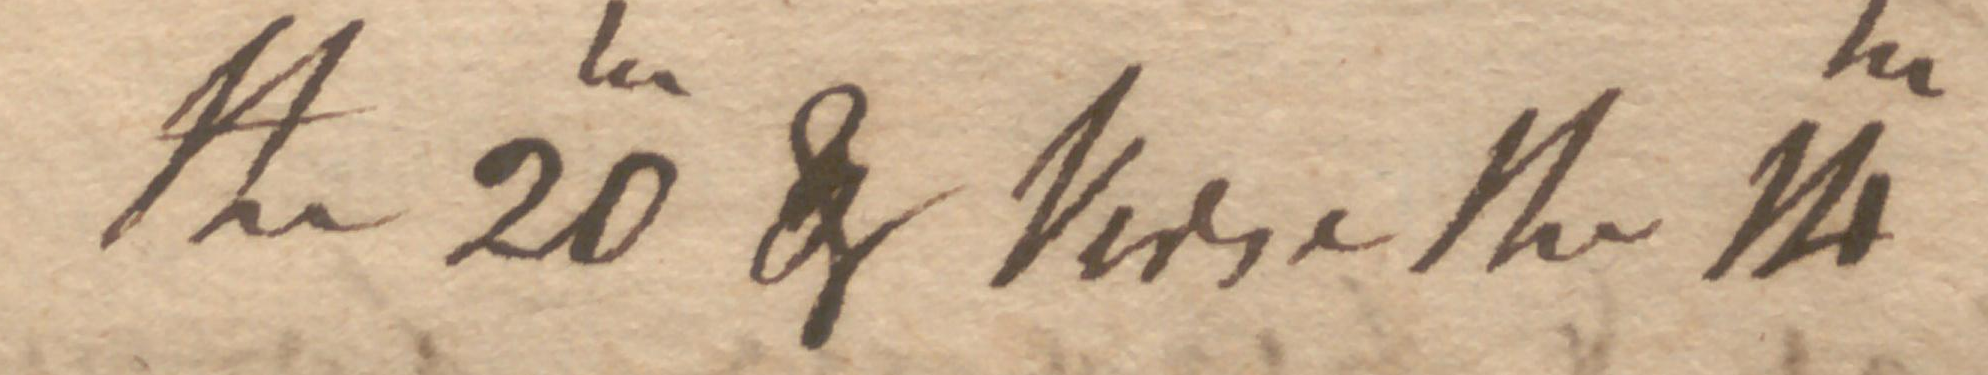the 20^th & Verse the 14^th
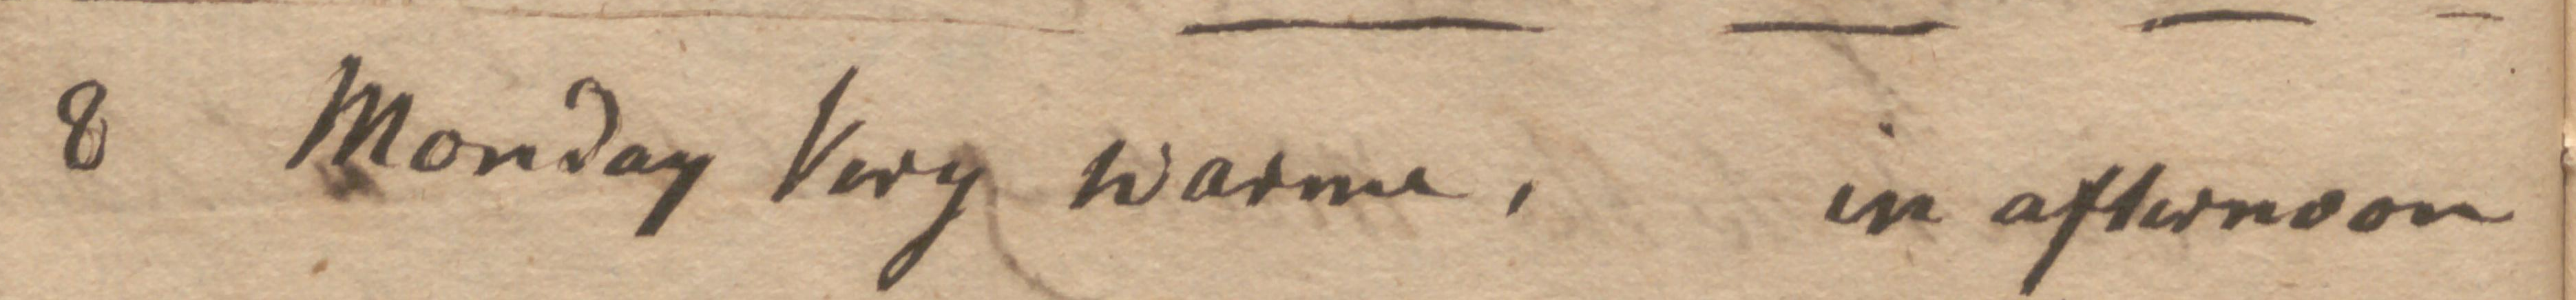8 Monday Very warme, in afternoon
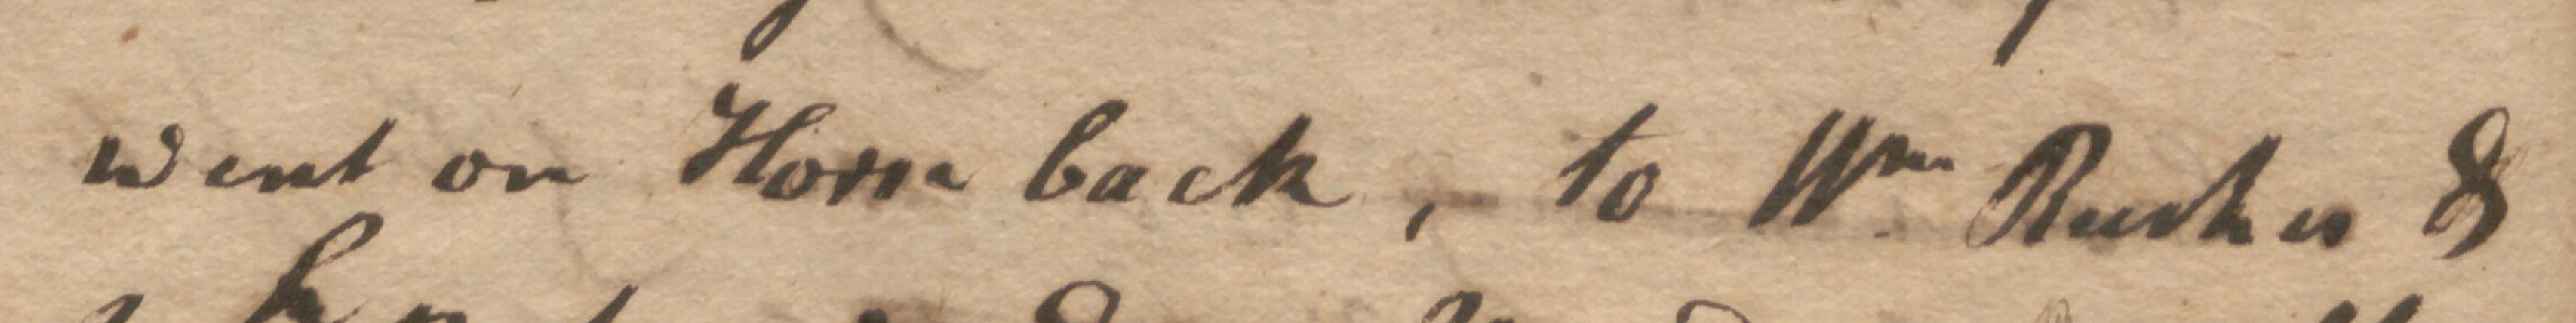went on Horse back, to W^m. Ruches &
